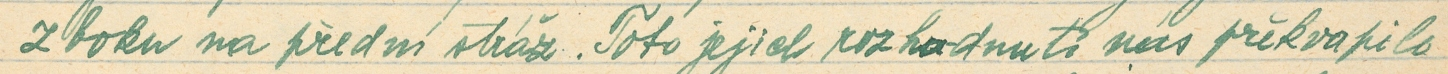z boku na přední stráž. Toto jejich rozhodnutí nás překvapilo
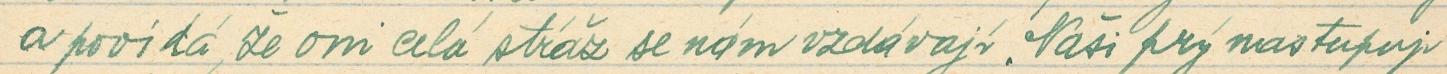a povídá, že oni celá stráž se nám vzdávají. Naši prý nastupují
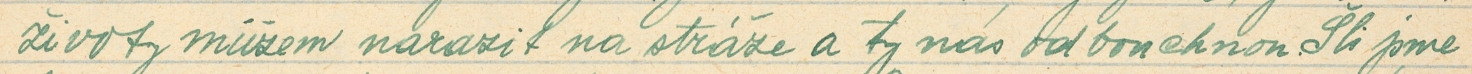životy můžem narazit na stráže a ty nás odbouchnou. Šli jsme
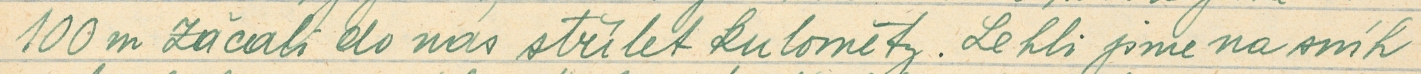100 m začali do nás střílet kulomety. Lehli jsme na sníh
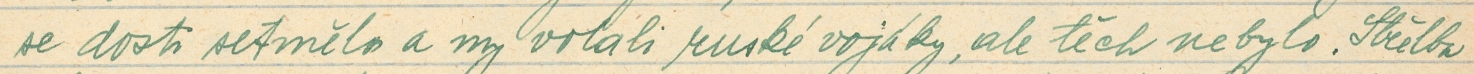se dosti setmělo a my volali ruské vojáky, ale těch nebylo. Střelba
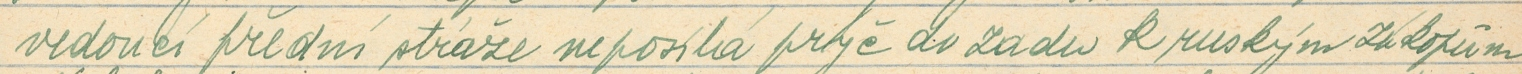vedoucí přední stráže neposílá pryč do zadu k ruským zákopům
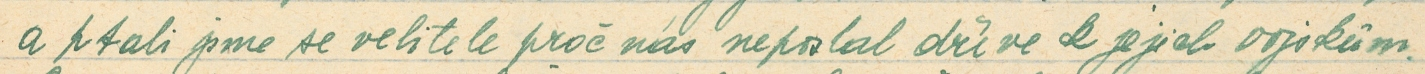a ptali jsme se velitele proč nás neposlal dříve k jejich vojskům.
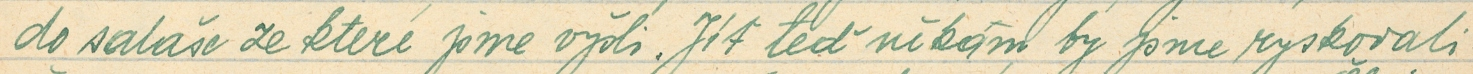do salaše ze které jsme vyšli. Jíť teď někám by jsme ryskovali
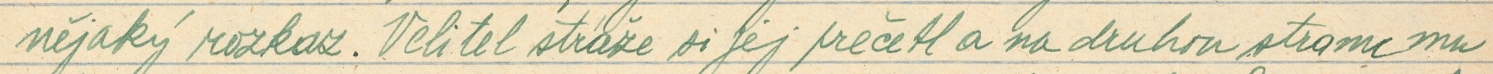nějaký rozkaz. Velitel stráže si jej přečetl a na druhou stranu mu
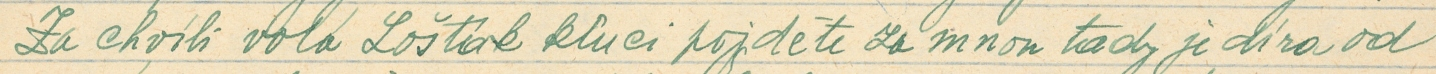Za chvíli volá Lošták kluci pojděte za mnou tady je díra od
